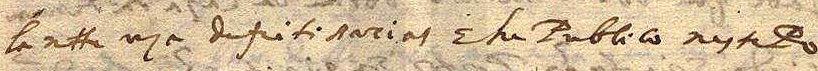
lantte uza de feitissarias E he Publico neste Po
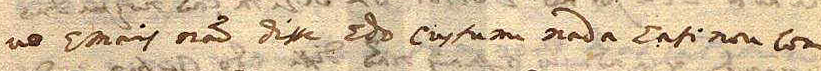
uo E mais naõ disse E do custume nada E asinou com
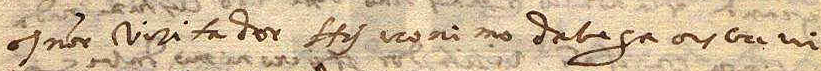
o snōr Vizitador Hyeronimo da vega o escreui
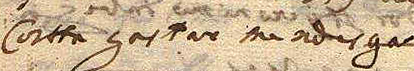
Costta gasPar mendes ga
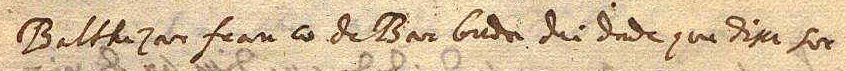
Balthezar franco de Barbuda de idade que disse ser
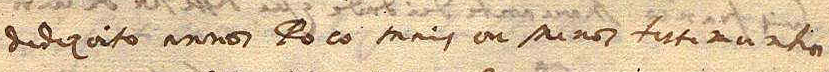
de dezoito annos Poco mais ou menos testemunha
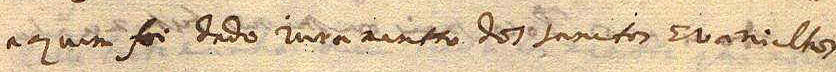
a quem foi dado iuramentto dos sanctos Evanielhos
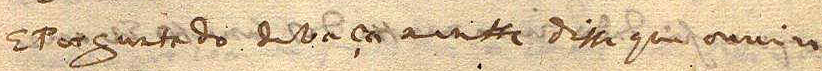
E Perguntado devaçamentte disse que ouuiu
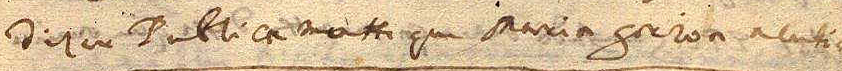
dizer Publicamentte que Maria gorioa a cuti
